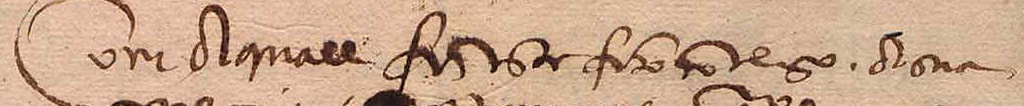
Com A quall fis este ft̄o cōcluso. A sua
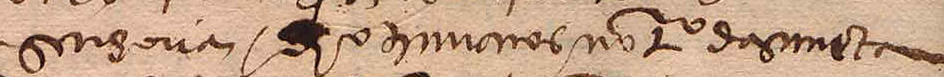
senhoria / djo trauaços notro da sancta
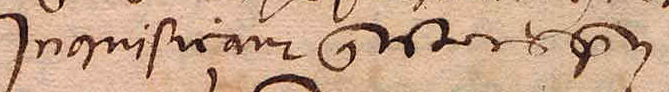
Jnquisiçam q̄ esto esp̄j
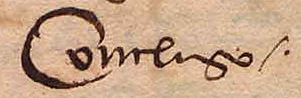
Concluso /.
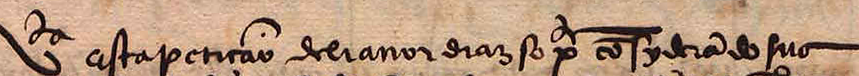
Vta Esta petiçaõ de lianor diaz sopte cōsyderādo sua
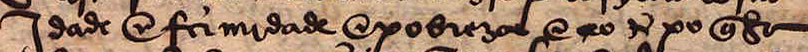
Jdade ēfermjdade e pobreza e ao tēpo q̄ ha
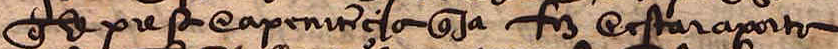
q̄ he presa e a penitēcia q̄ Ja fez ē estar a porta
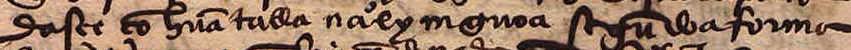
da see c̄o huā talla na lymguoa segūdo a forma
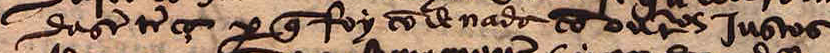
da sētēça ꝑ q̄ foy c̄odenada c̄o outros Justos
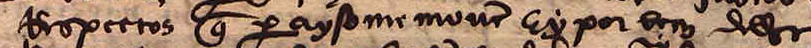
Respectos q̄ ꝑa ysso me mouē Ey por bem de lhe
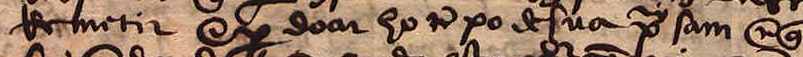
Remetir e ꝑdoar ho tēpo de sua prysam ē q̄
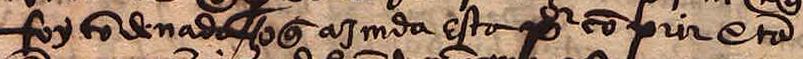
foy c̄odenada ho q̄ aJmda Esta por cōprir e tā
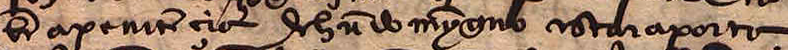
bē a penitēcia de hū domȳguo estar a porta
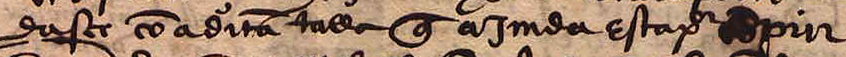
da see c̄o a dita talla q̄ aJmda Esta por cōprir
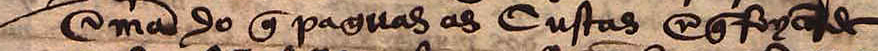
e mādo q̄ paguas as Custas ē q̄ foy c̄ode
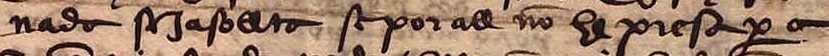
nada seJa sollta se por all n̄o he presa ꝑa
